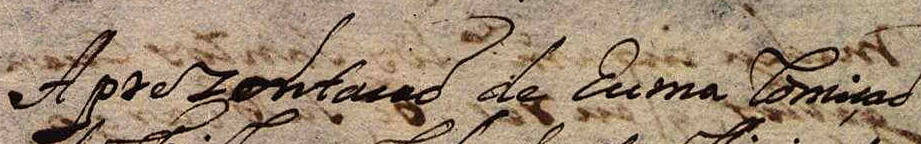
Aprezentaçaõ de huma Comiçaõ
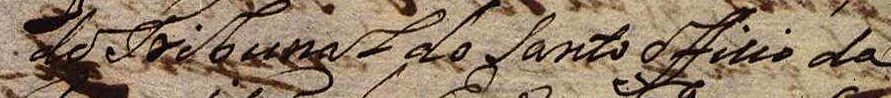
do Tribunal do Santo officio da
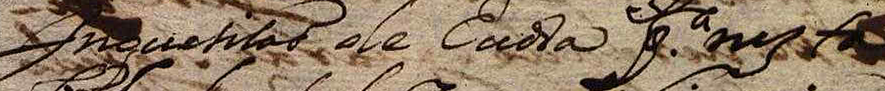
Jnquisiçaõ de Euora p.a nesta
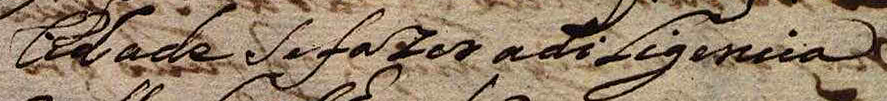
Cidade se fazer a diligencia
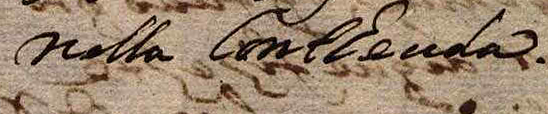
nella contheuda.
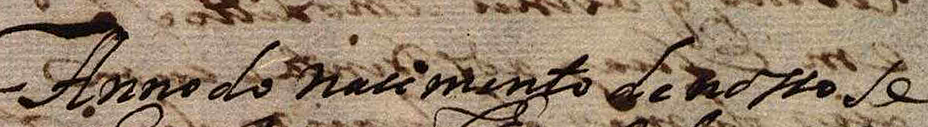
Anno do nacimento de nosso se
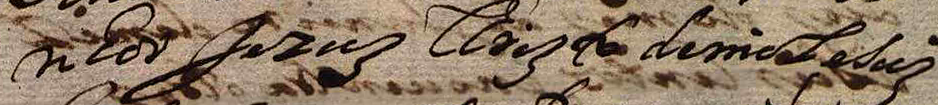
nhor Jezus Christo de mil e seiz
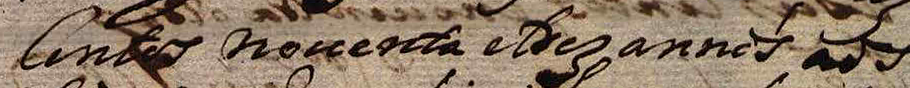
Centos nouenta e trez annos aos
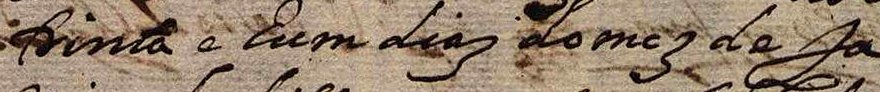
trinta e hum diaz do mez de Ja
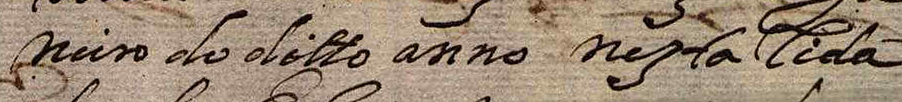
neiro do ditto anno nezta Cida
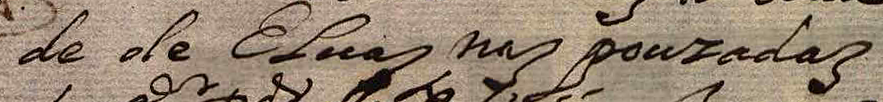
de de Eluas naz pouzadaz
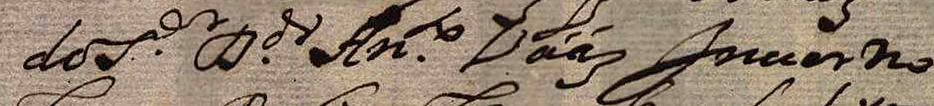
do S.or D.or An.to Vááz Jnuerno
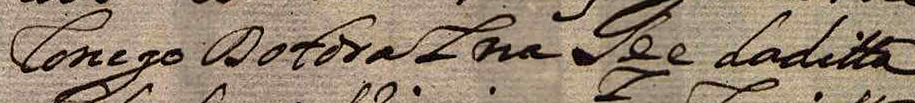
Conego DotoraL na See da ditta
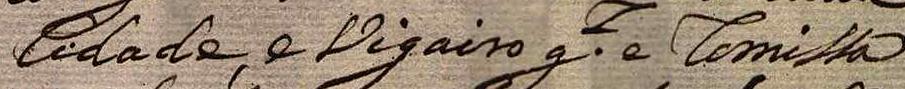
Cidade, e Vigairo g.l e Comissa
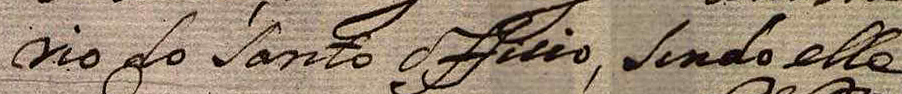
rio do Santo officio, sendo elle
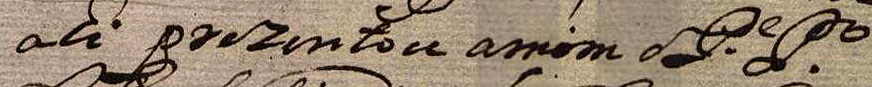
ahi prezentou a mim o P.e P.o
